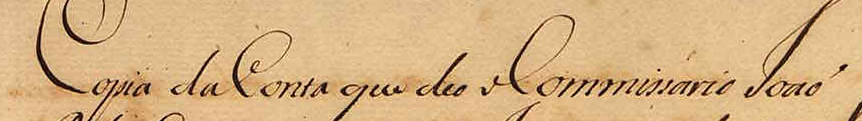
Copia da Conta que deo o Commissario Ioaõ
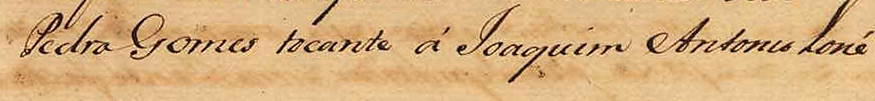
Pedro Gomes tocante á Ioaquim Antonio Loné
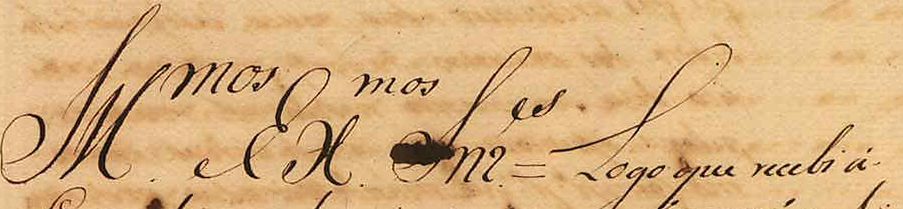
Illmos e EX.mos- Snr.es= Logo que recebi á
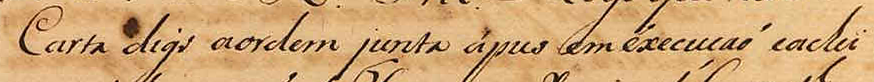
Carta digo a ordem junta á pus em execuçaõ e achei
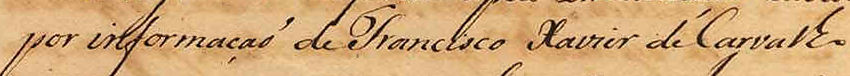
por informaçaõ de Francisco Xavier de Carvalho
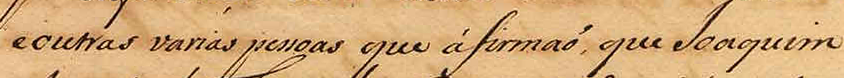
e outras varias pessoas que áfirmaõ, que Ioaquim
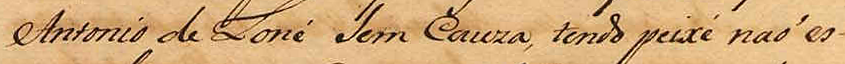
Antonio de Loné Sem Cauza, tendo peixe naõ es
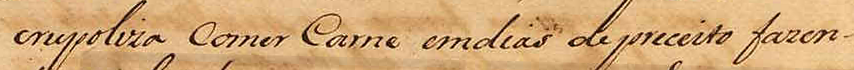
crupoliza comer Carne em dias de preceito fazen
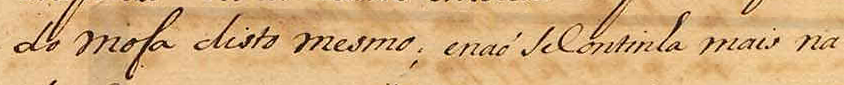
do mofa disto mesmo; e naõ se Continha mais na
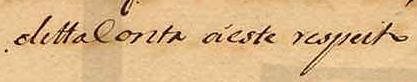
ditta conta á este respeito
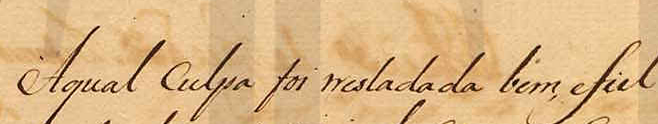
A qual Culpa foi tresladada bem, e fiel
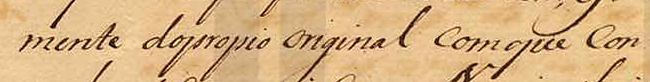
mente do propio original com que con
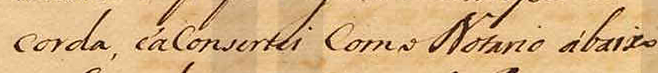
corda, e a Consertei Com o Notario abaixo
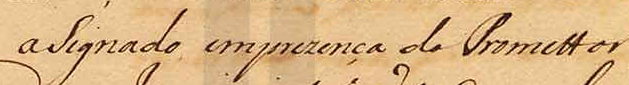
aSignado em prezença do Promettor
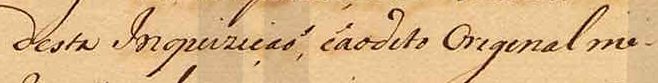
desta Inquiziçaõ, e ao dito Original me
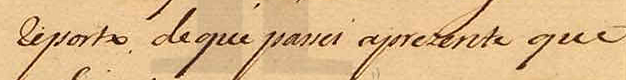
Reporto, de que passei a prezente que
